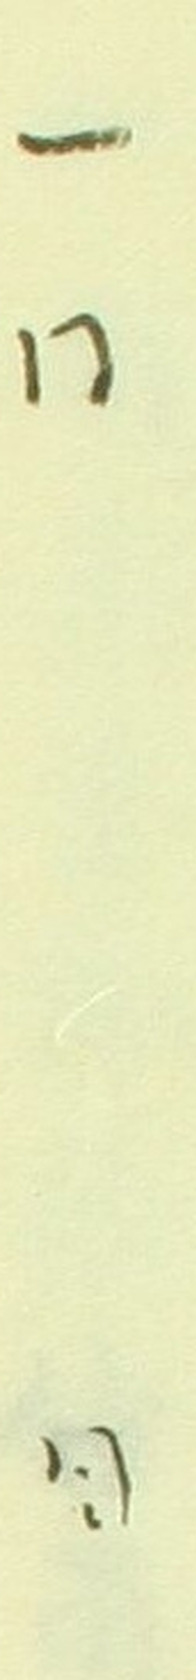一同同
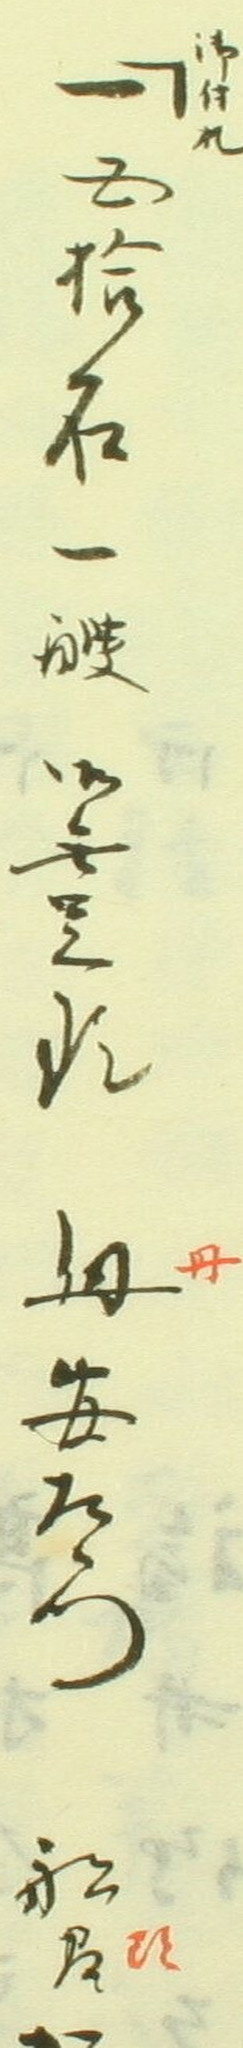一五拾石一艘御？足頭丹安左衛門船頭か子
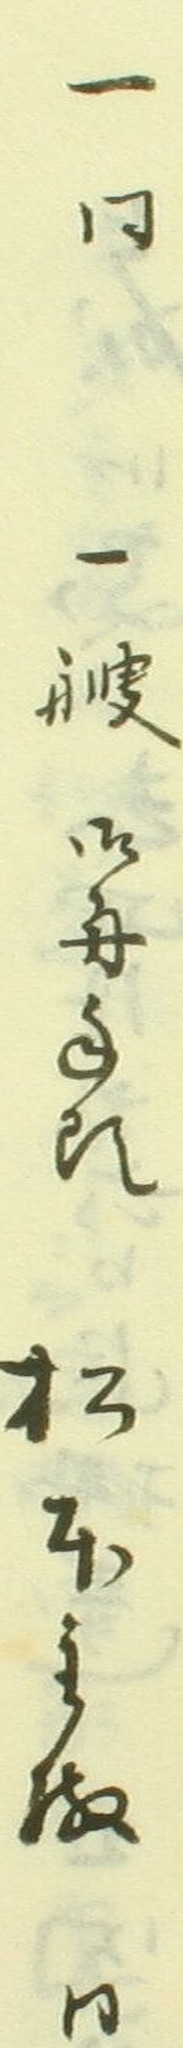一同一艘御舟手頭松本主殿同
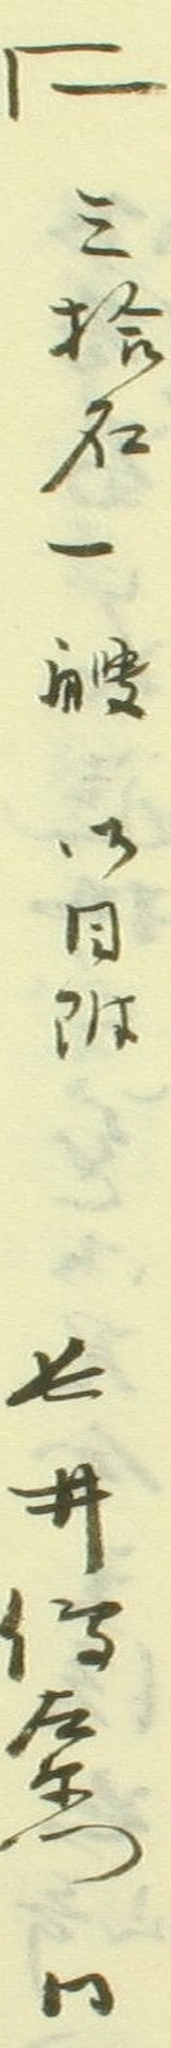一三拾石一艘御目附長井伝左衛門同
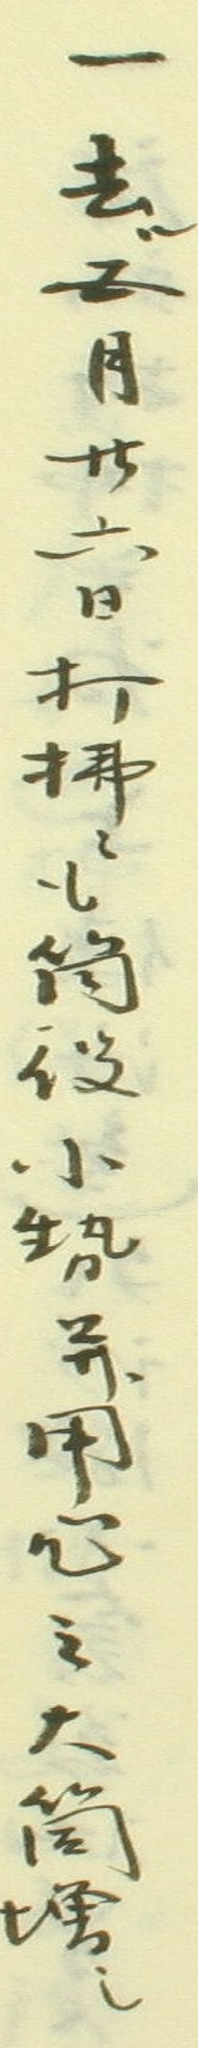一去る五月廿六日打払にも筒役小勢並用心之大筒増し
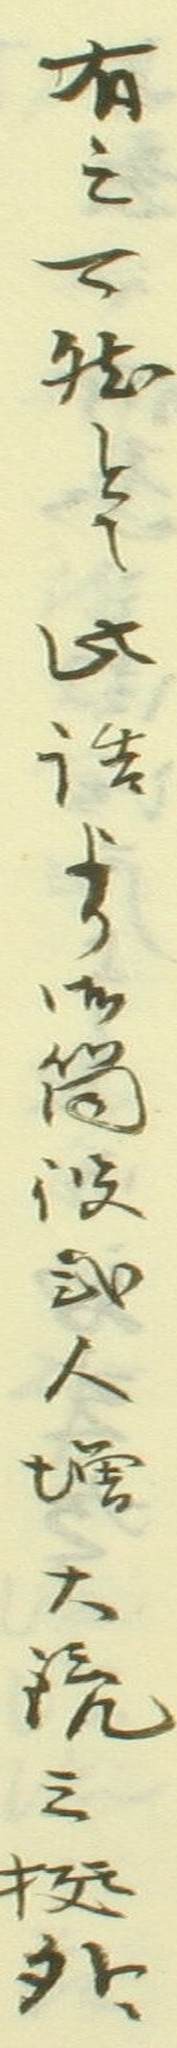有之可然ことし此詰より御筒役弐人増大銃三挺外へ
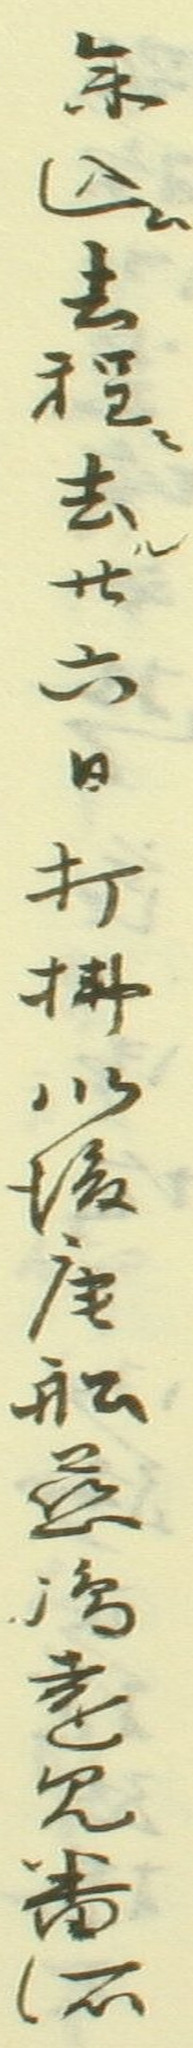参込む去程に去る廿六日打払唐船慈嶋遠見番所
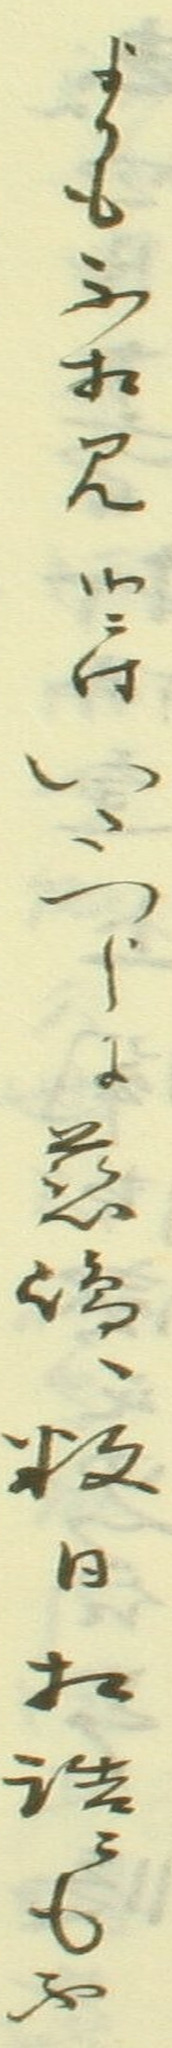よりも不相見候に付いたつらに慈嶋へ数日相詰にも不
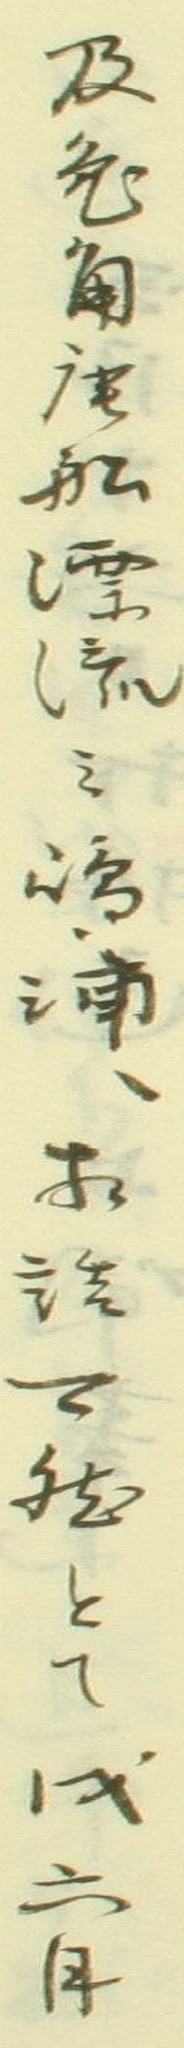及兎角唐船漂流之嶋浦へ相詰可然とて戌六月
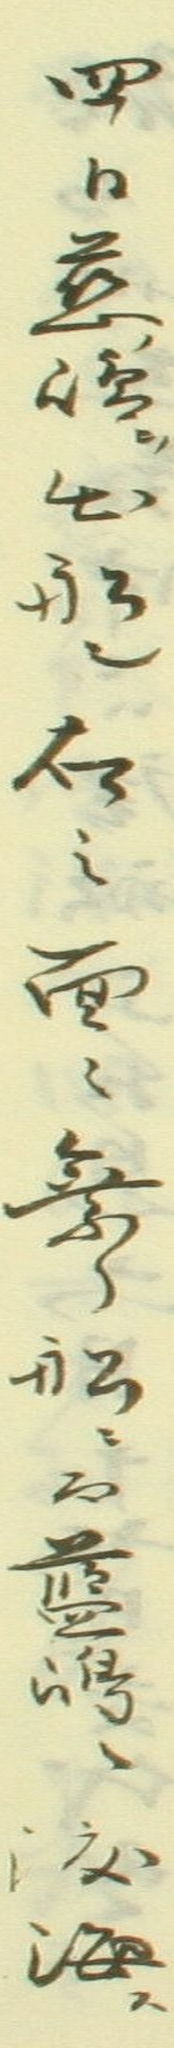四日慈嶋を出船し右之面々乗り船に而藍嶋へ渡海す
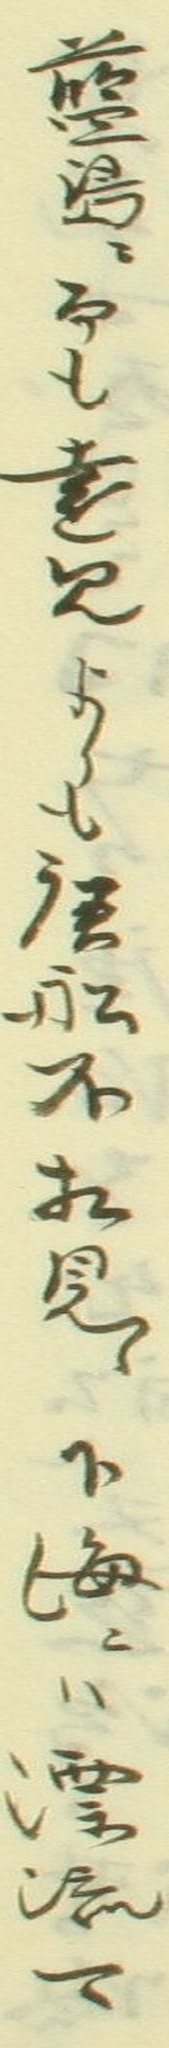慈嶋に而も遠見よりも唐船不相見候下海には漂流可
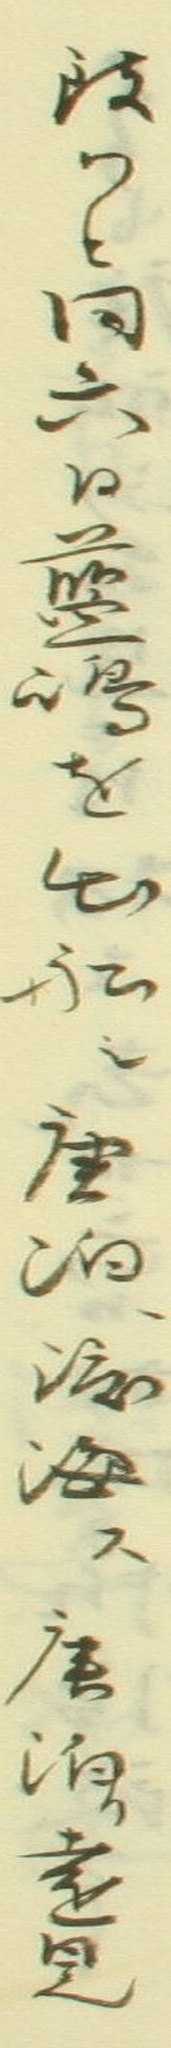致候と同六日藍嶋を出船し唐泊へ渡海す唐泊り遠見

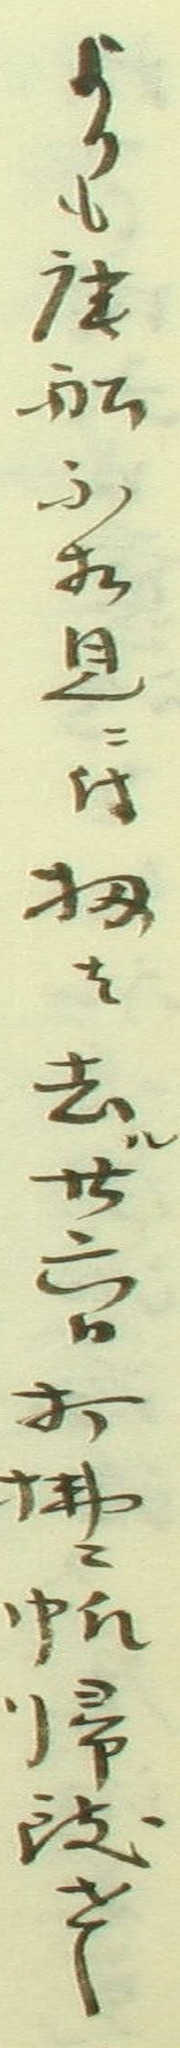よりも唐船不相見に付扨は去る廿六日打払に帆帰致せし
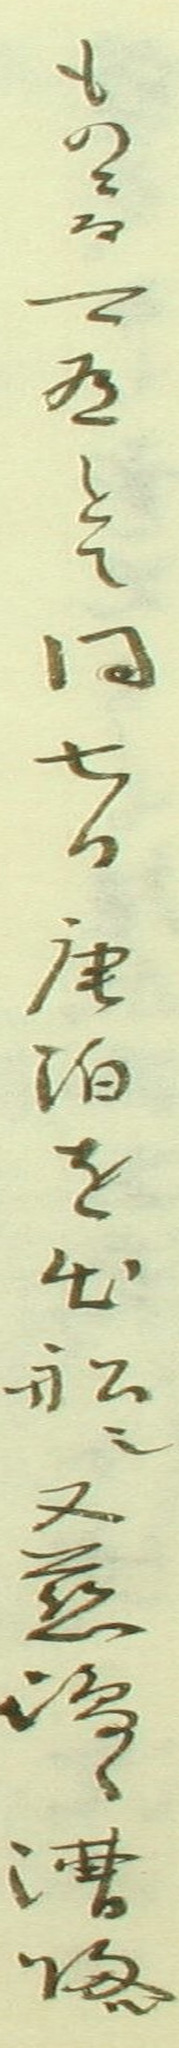ものに而可有とて同七日唐泊を出船し又慈嶋へ漕帰る
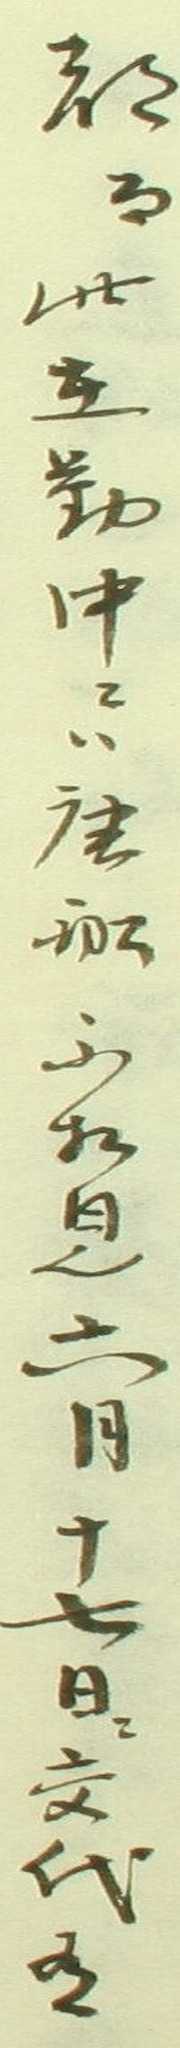都而此在勤中には唐船不相見六月十七日に交代有
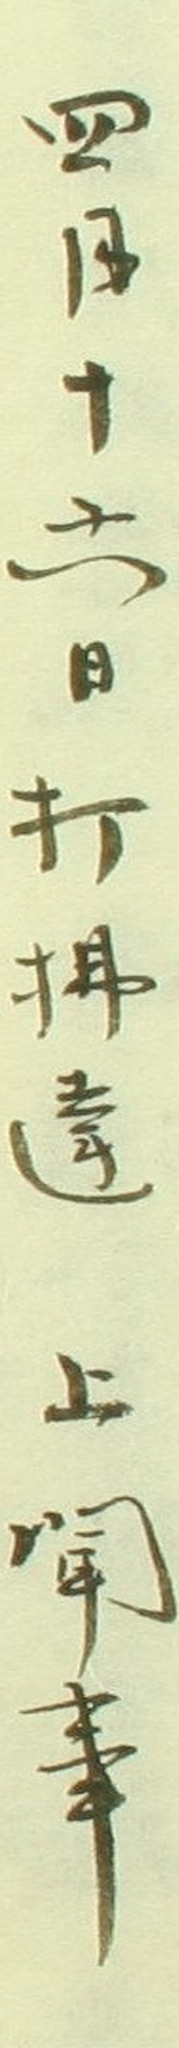四月十六日打払違上聞事
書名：唐船漂流記 三
